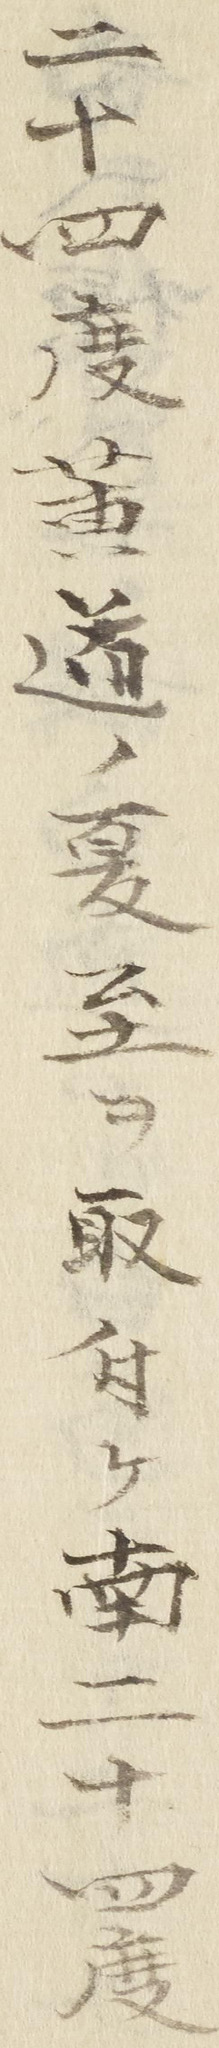二十四度黄道ノ夏至ヲ取付ケ南二十四度
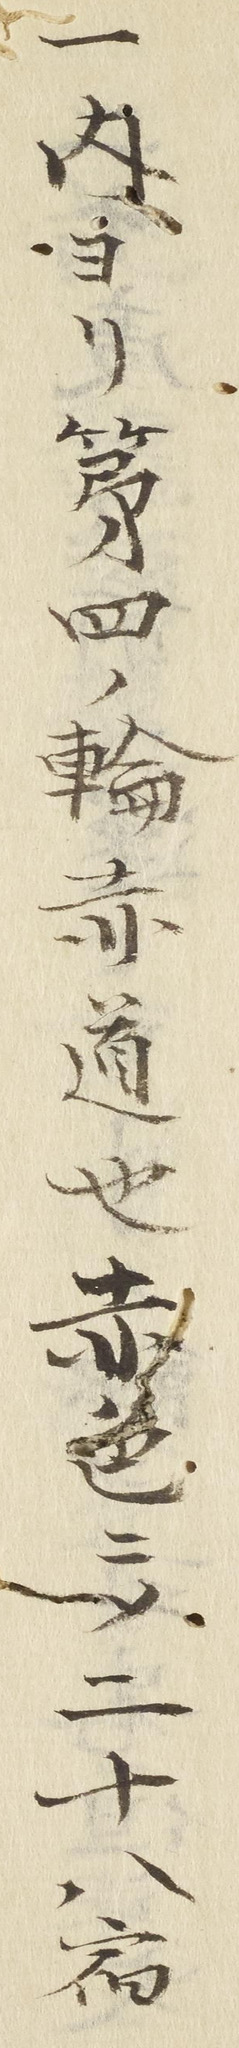一内ヨリ第四ノ輪赤道也赤色ニシテ二十八宿
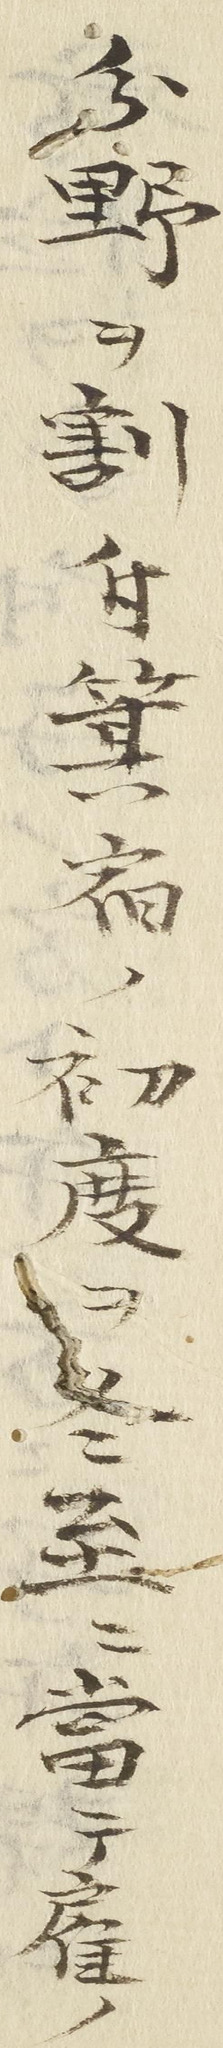分野ヲ割付箕宿ノ初度ヲ冬至ニ当テ雇ノ
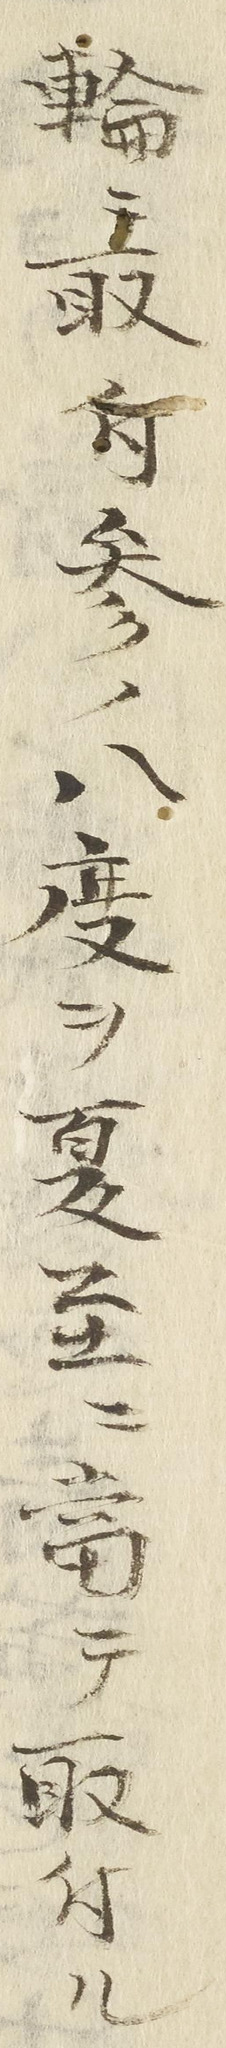輪ニ取付参ノ八度ヲ夏至ニ当テ取付ル
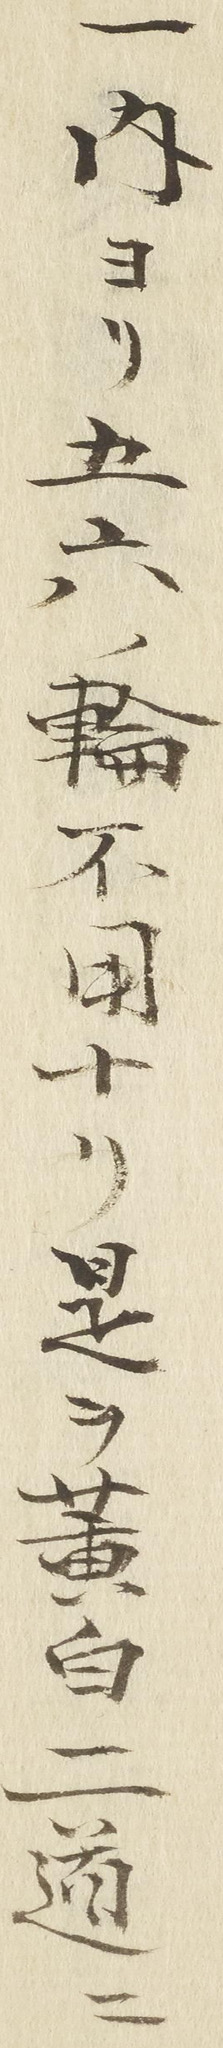一内ヨリ五六ノ輪不用ナリ是ヲ黄白道二道ニ
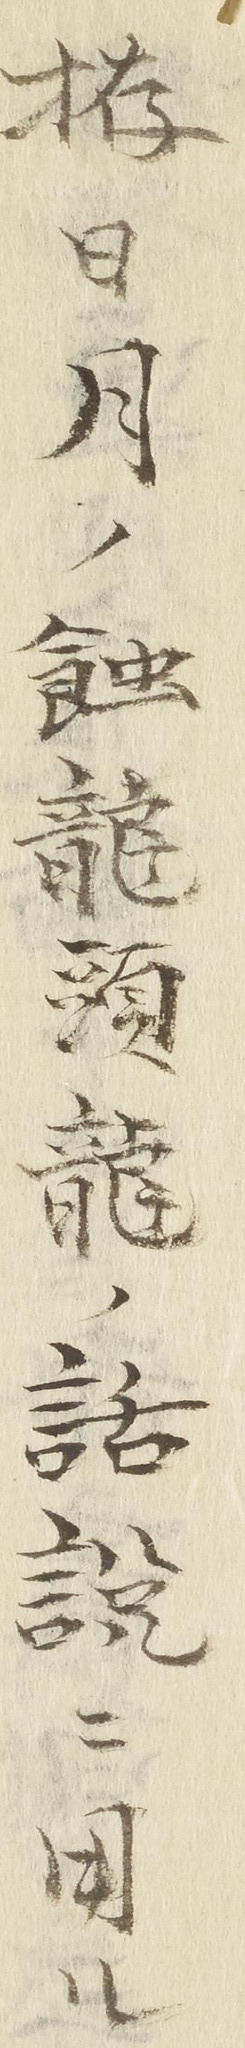拵日月ノ蝕龍頭龍ノ話説ニ用ル
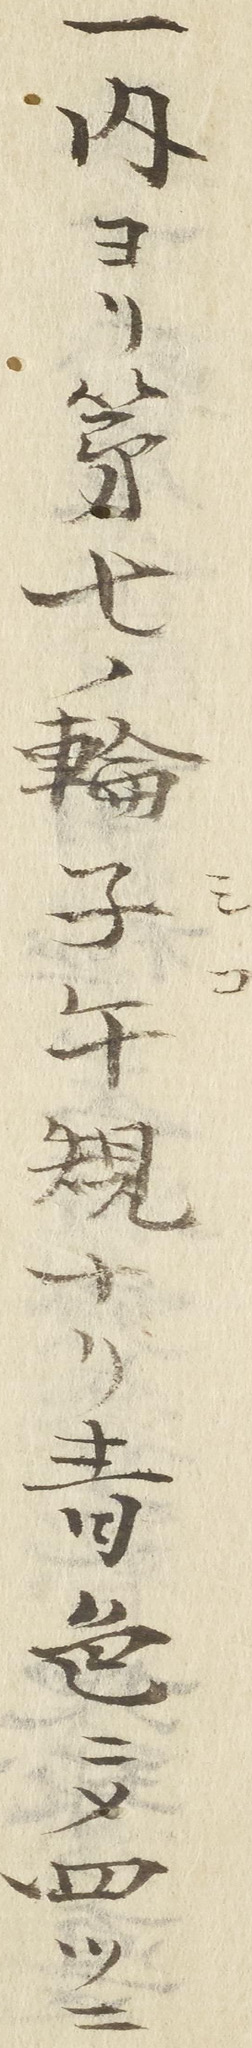一内ヨリ第七ノ輪子午規ナリ青色ニシテ四ツニ
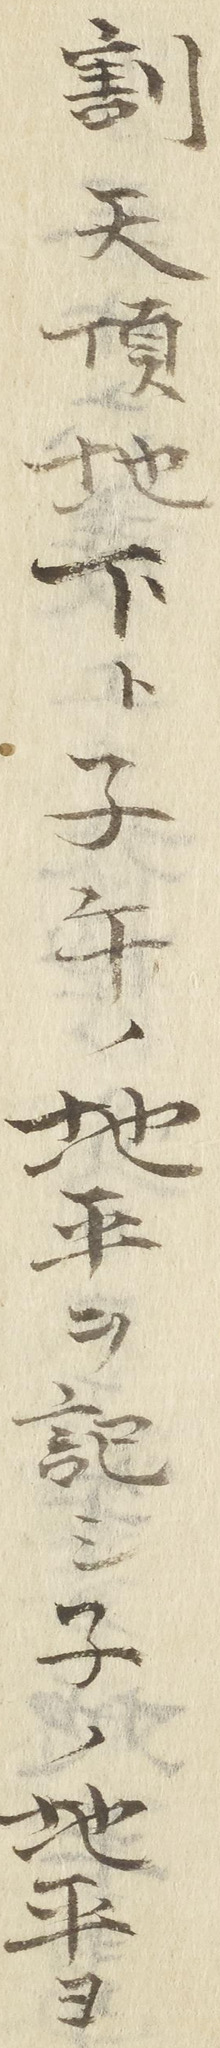割天頂地下ト子午ノ地平ヲ記シ子ノ地平ヨ

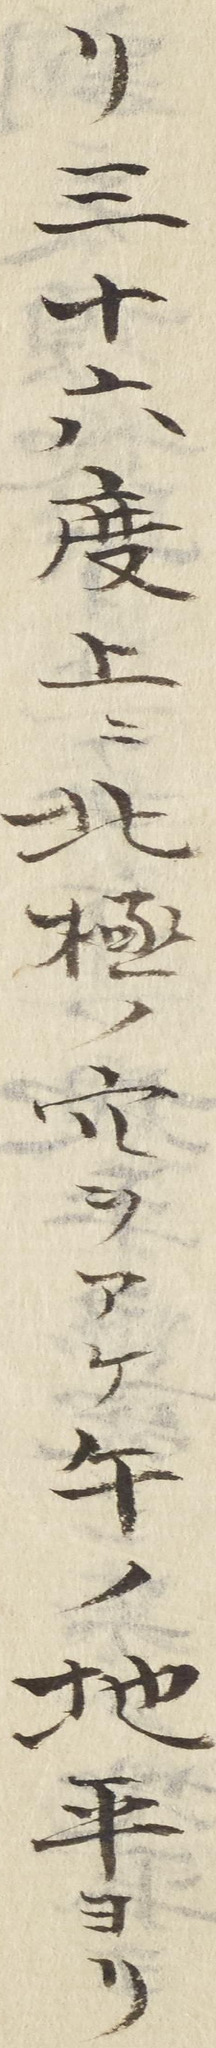リ三十六度上ニ北極ノ穴ヲアケ午ノ地平ヨリ
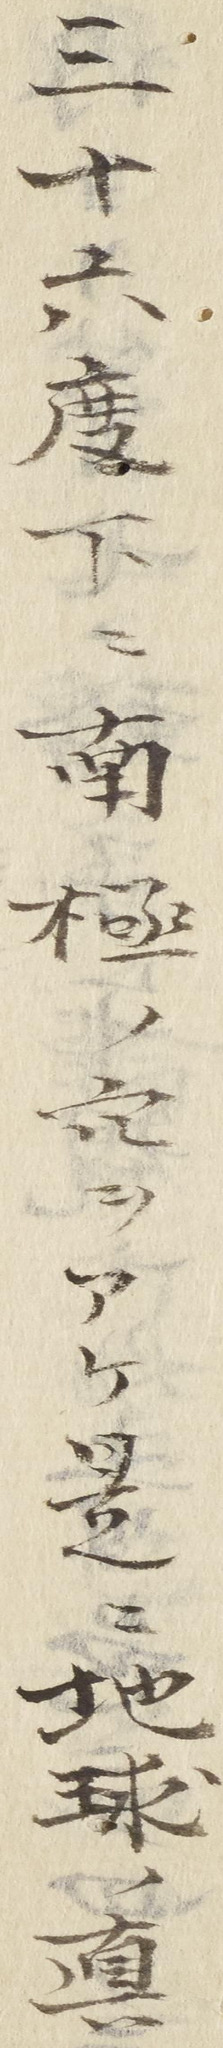三十六度下ニ南極ノ穴ヲアケ是ニ地球ノ真
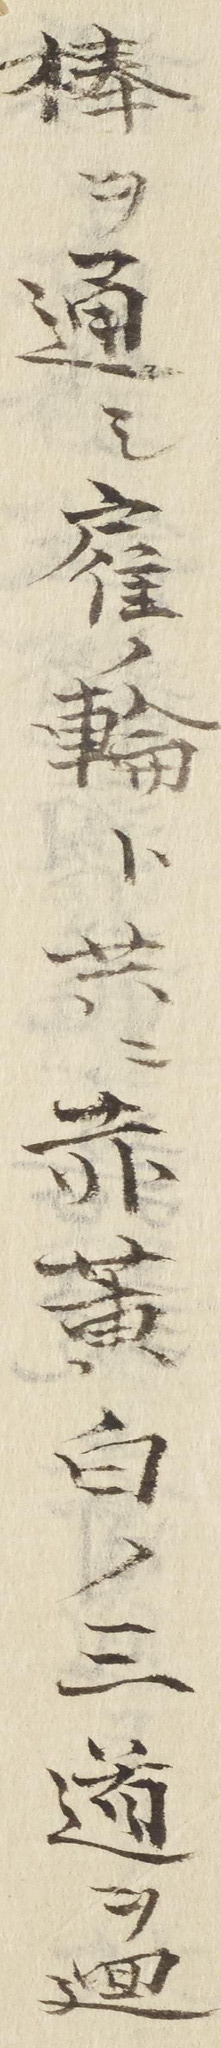棒ヲ通シ雇ノ輪ト共ニ赤黄白ノ三道ヲ廻
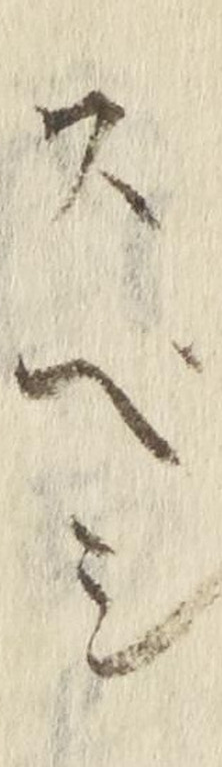スベシ
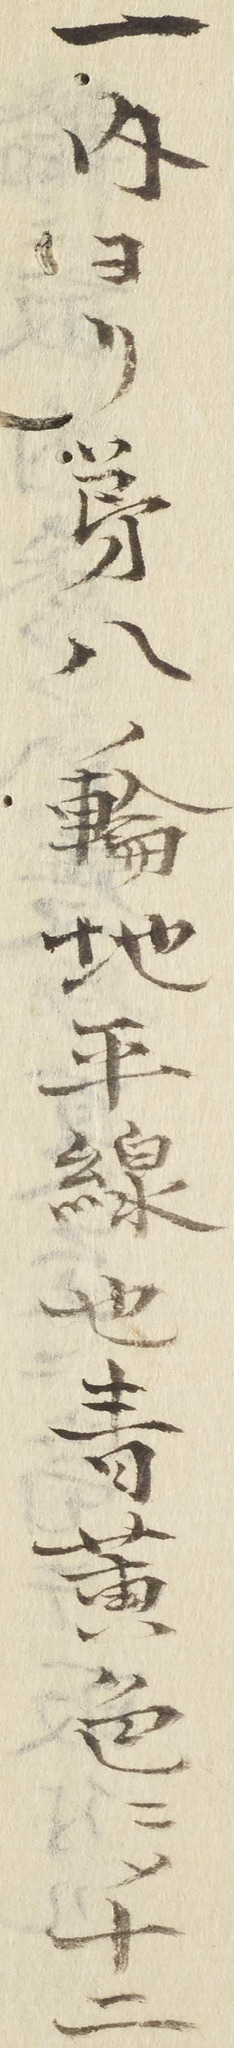一内ヨリ第八ノ輪地平線也青黄色ニシテ十二
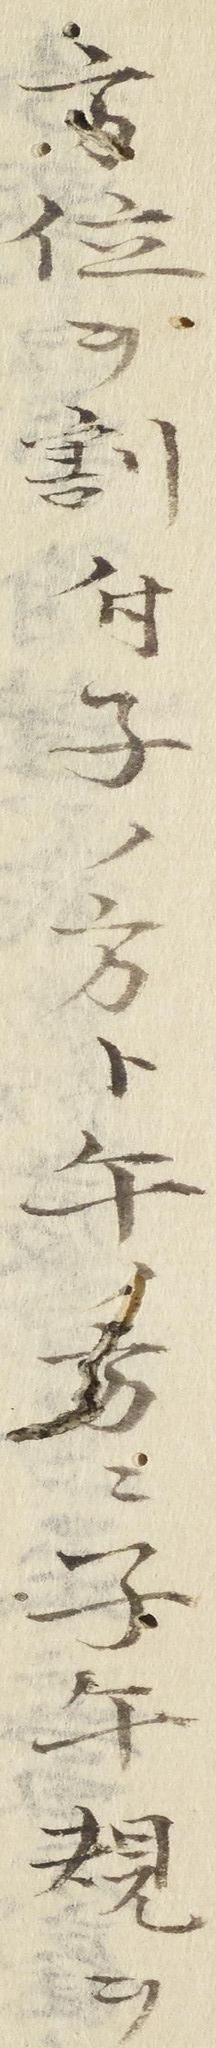方位ヲ割付子ノ方ト午ノ方ニ子午規ヲ
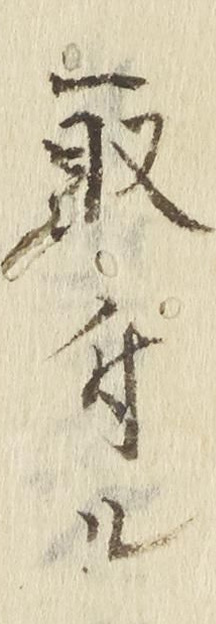取付ル
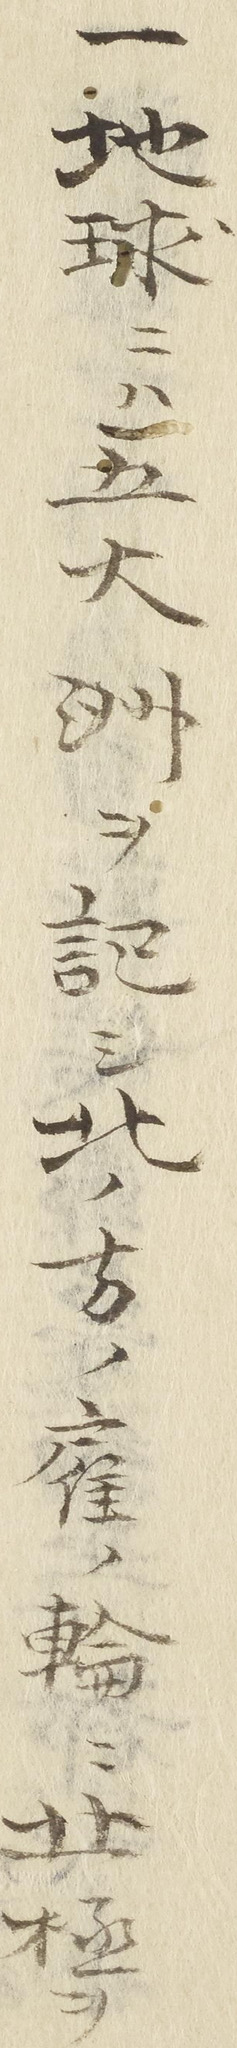一地球ニハ五大洲ヲ記シ北ノ方ノ雇ノ輪ニ北極ヲ
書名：天象話説
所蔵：東京大学地震研究所図書室 Earthquake Research Institute Library, The University of Tokyo, JAPAN
